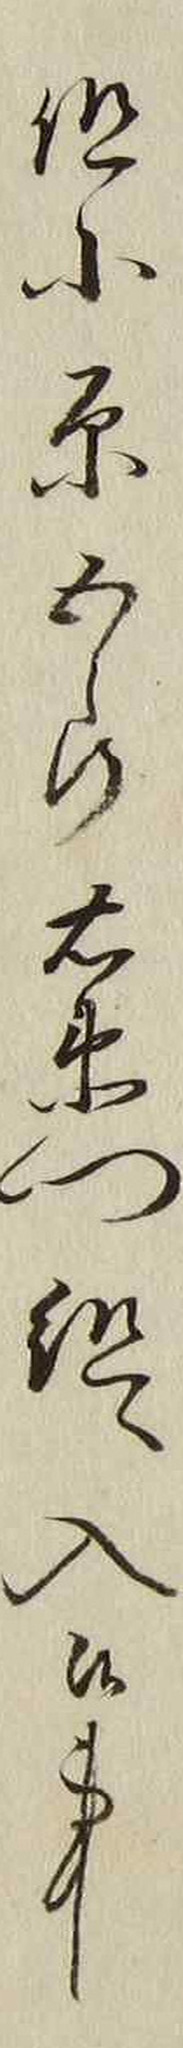但小原五郎右衛門組へ入候事
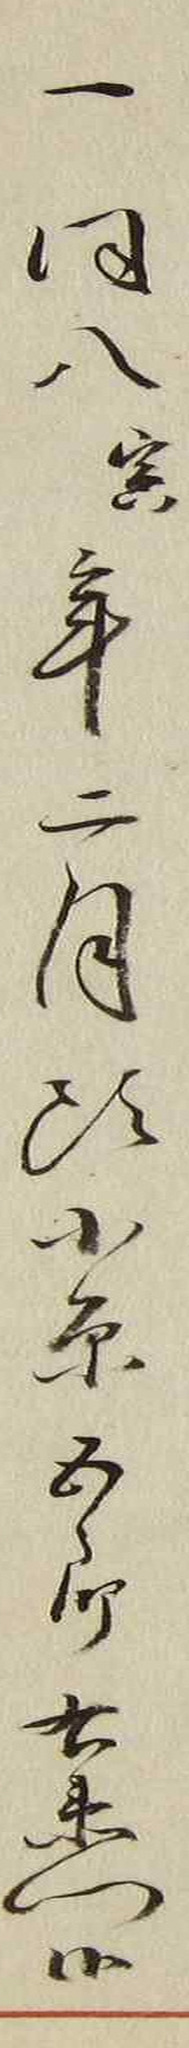一同八寅年二月頭小原五郎右衛門御
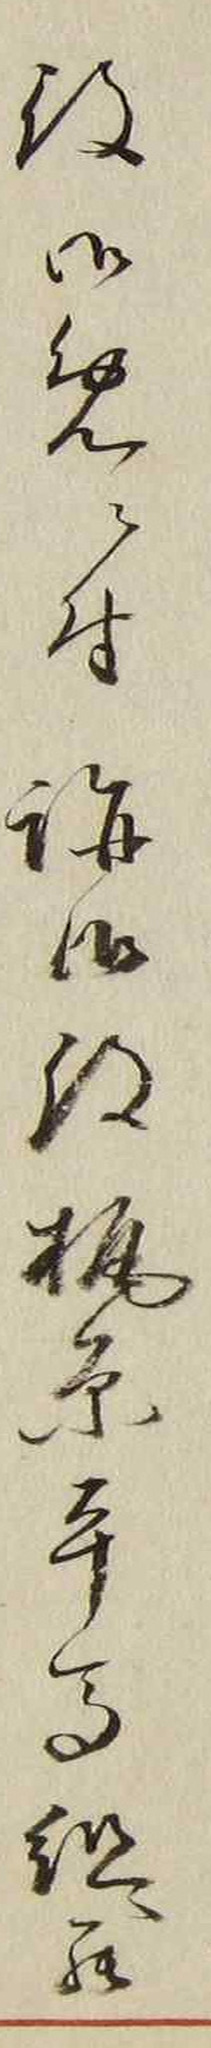役御免ニ付跡御役梶原平馬組へ罷

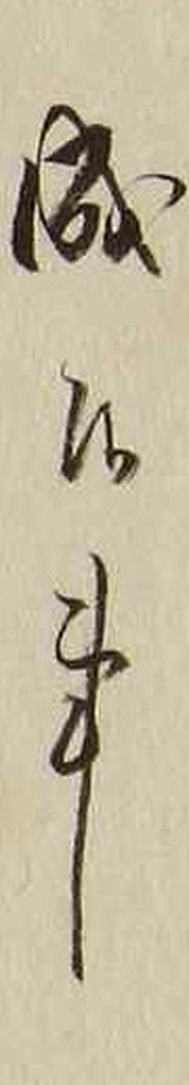成候事
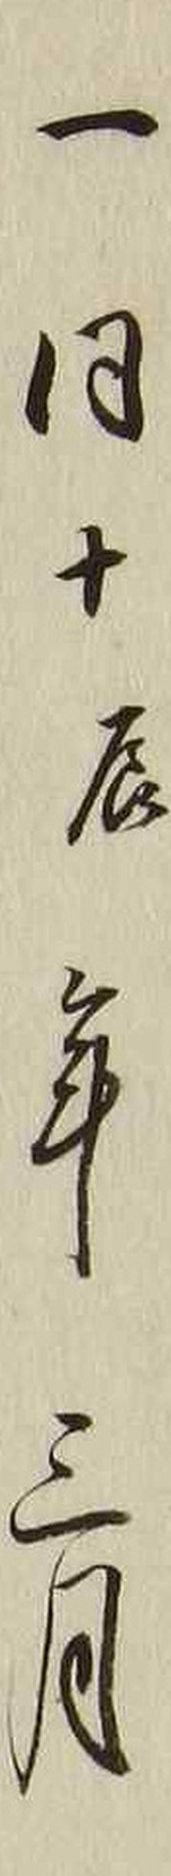一同十辰年三月
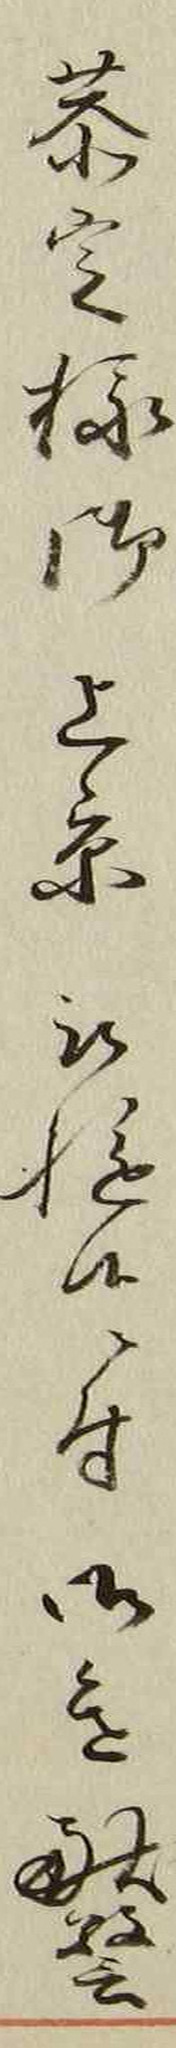恭定様御上京被遊候ニ付御進献譬
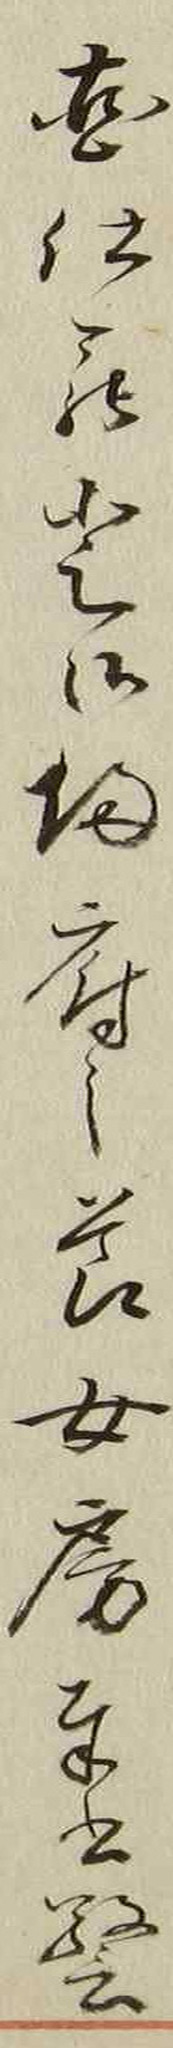固仕罷登御帰府之節女房奉書警
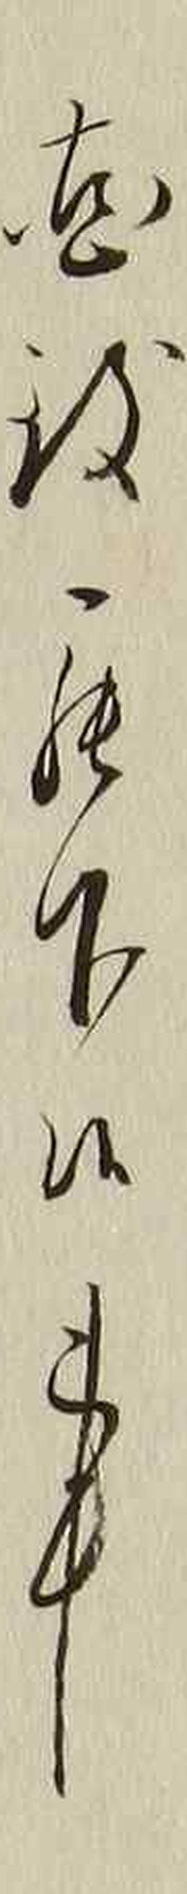固致罷下候事
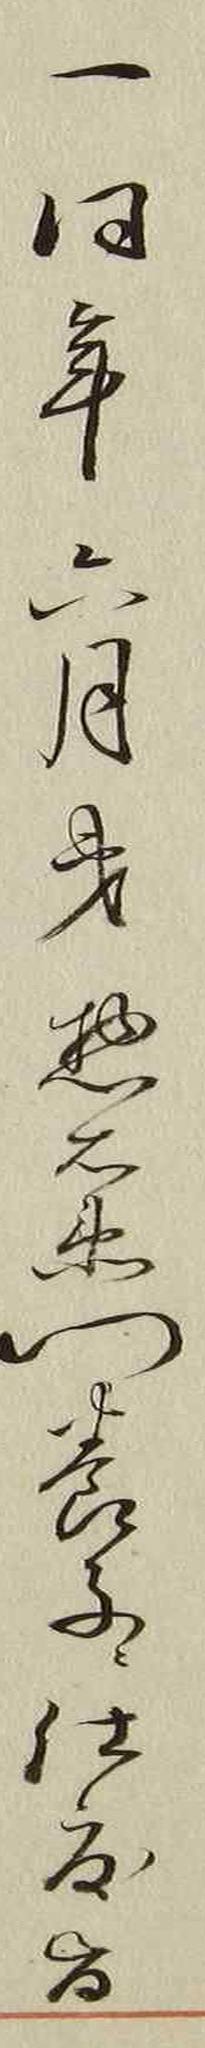一同年六月弟惣右衛門養子ニ仕度旨
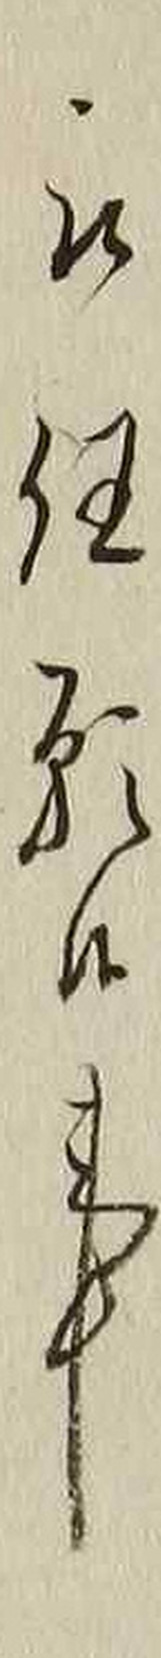被任願候事
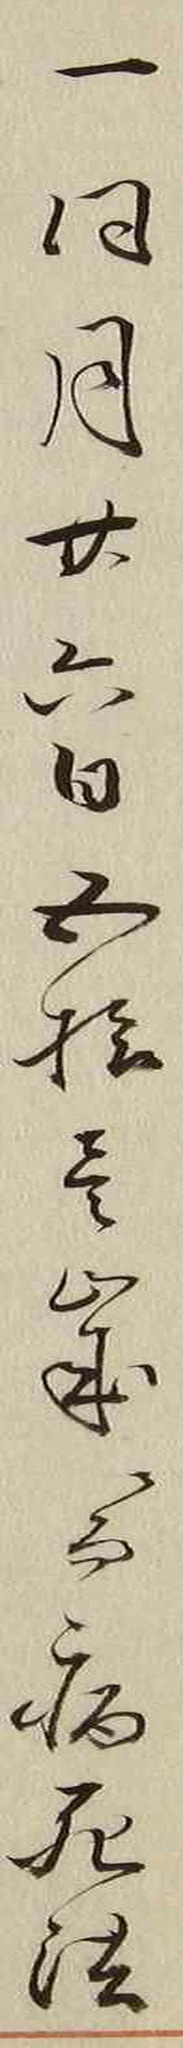一同月廿六日五拾壱歳ニ而病死法
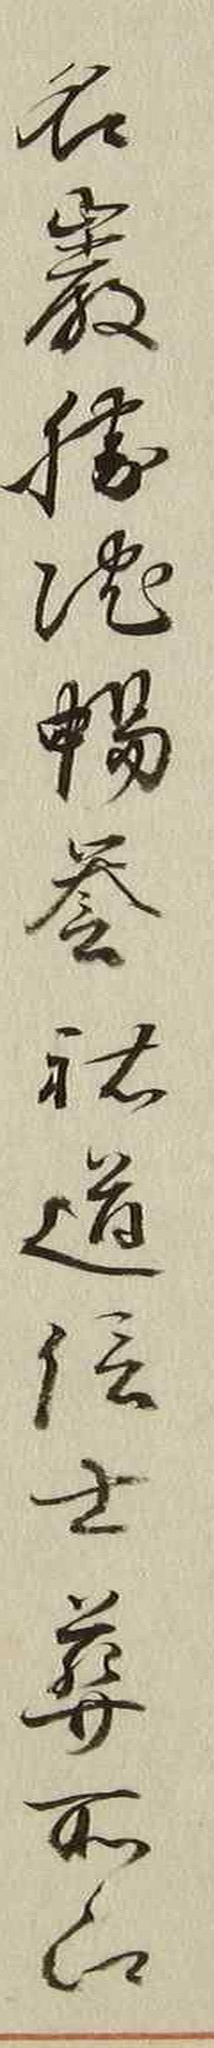名巌勝院暢誉祐道信士葬所江
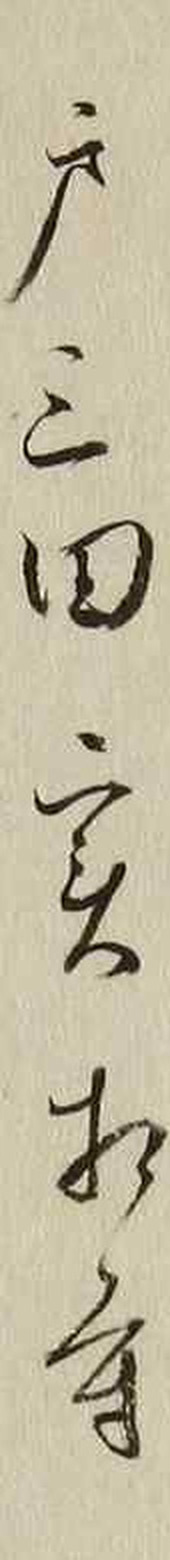戸三田実相寺
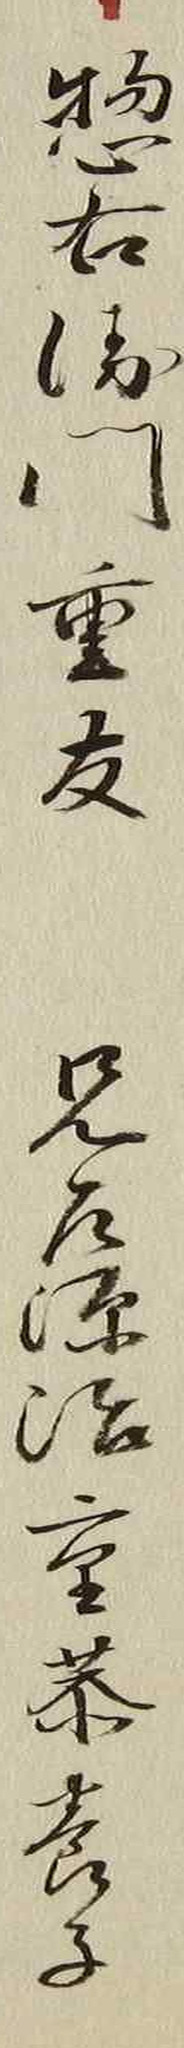惣右衛門重友兄左源治重恭養子
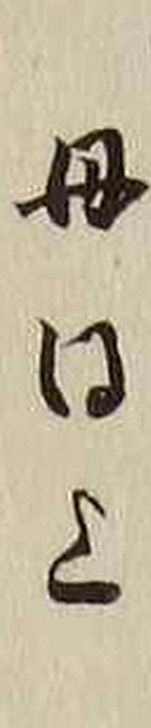母同上
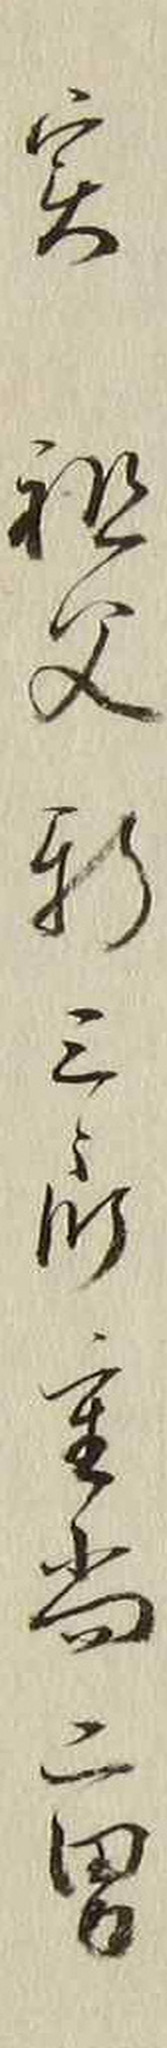実祖父新三郎重尚二男
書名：諸士系譜　巻之28　い之部28
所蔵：会津若松市立会津図書館
